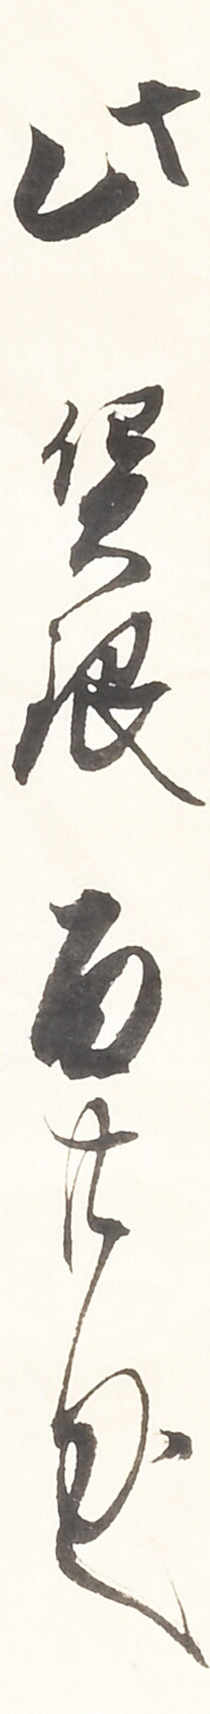此賃銀百廿匁
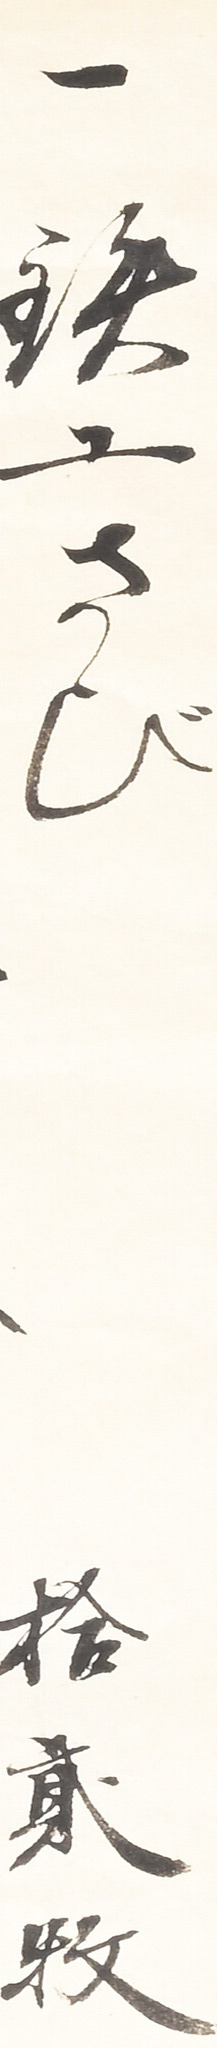一鉄工さび拾弐枚
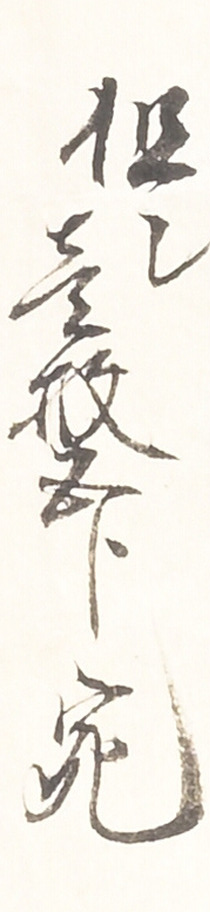壱匁五分宛
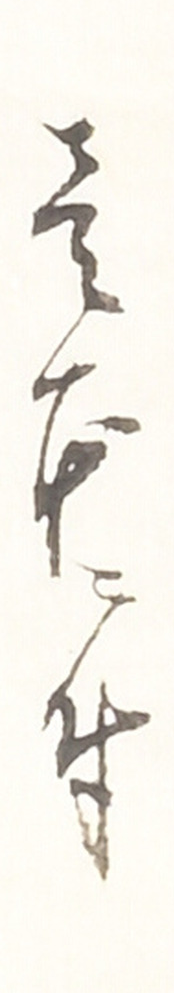壱本ニ付
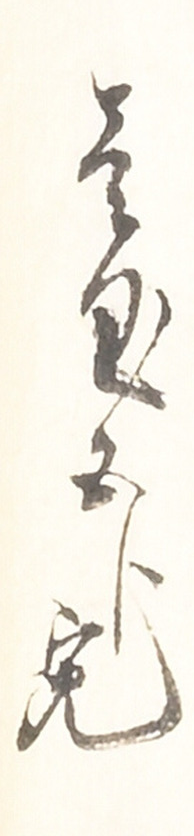壱匁五分宛
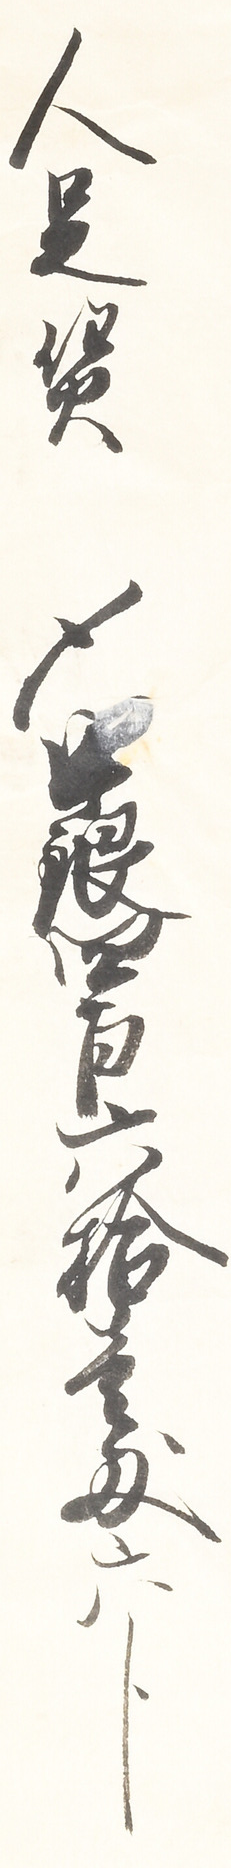人足賃〆甲銀四百六拾壱匁六分
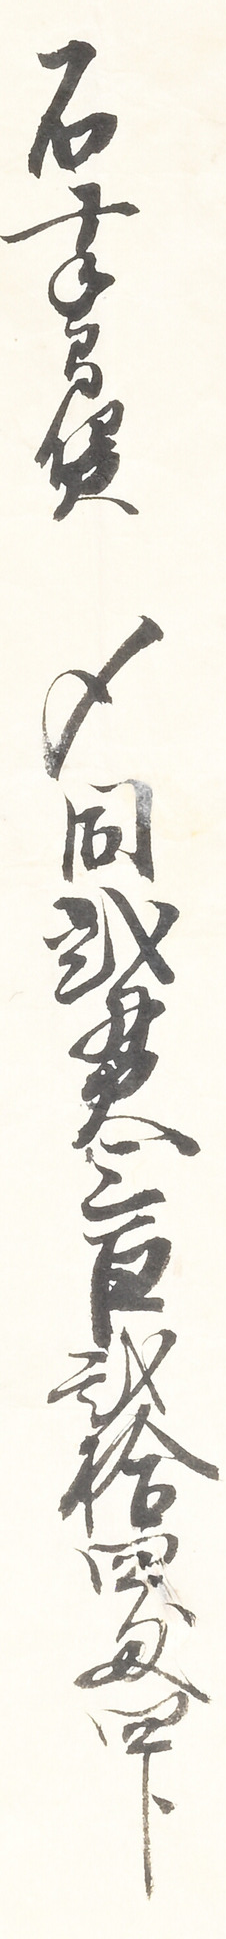石手間賃〆同弐貫三百弐拾四匁四分
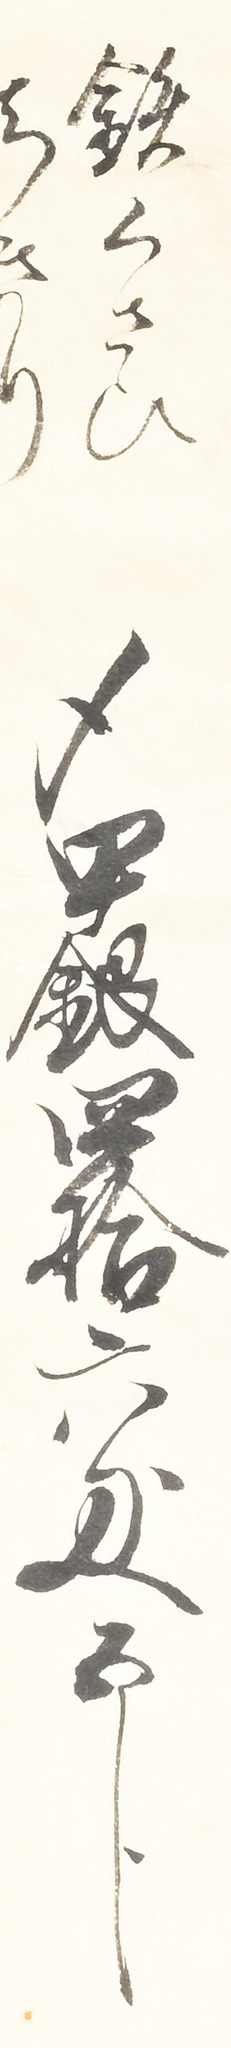鉄くさひ〆甲銀四拾六匁五分
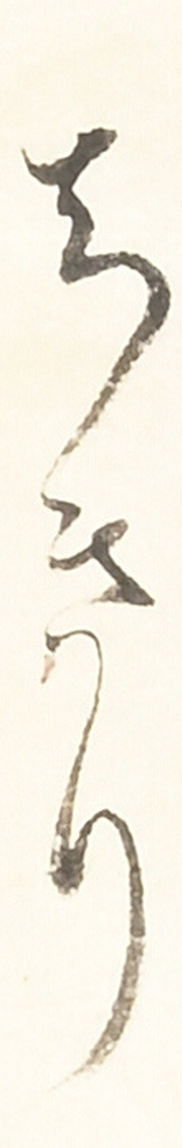ちきり

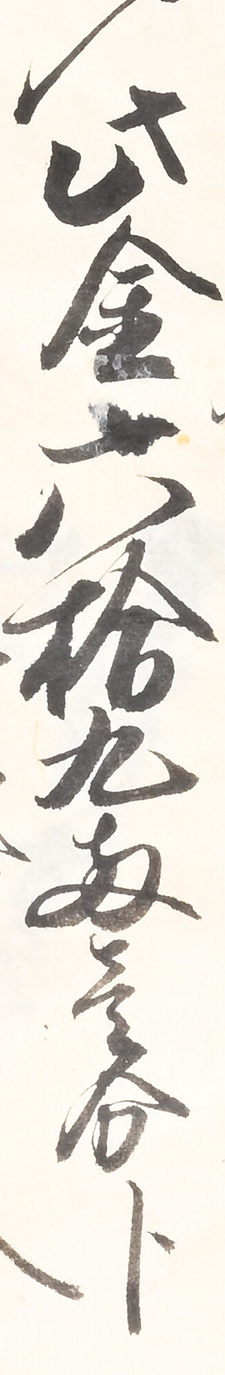〆此金六拾九匁壱分歩
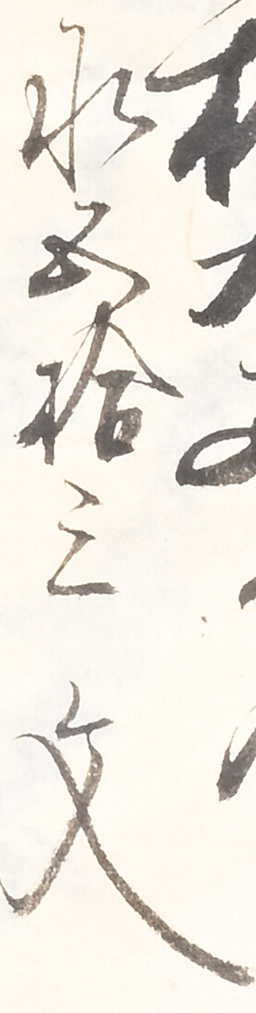永五拾三文
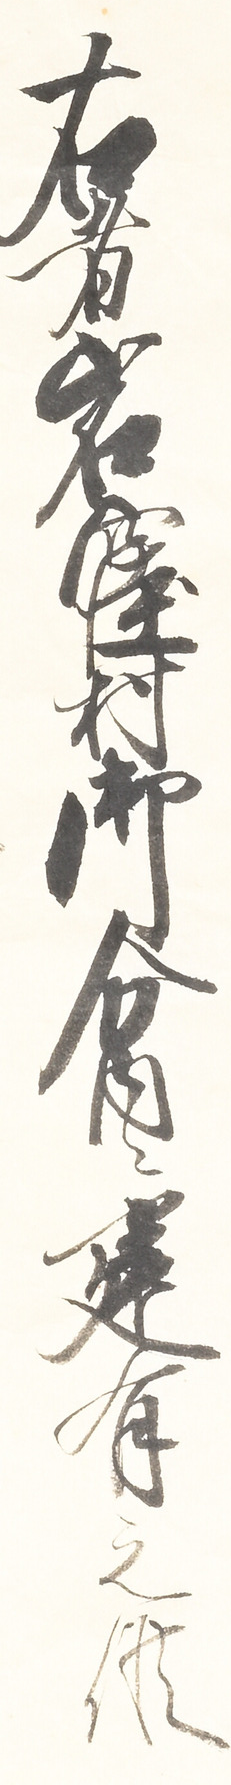右者岩窪村御分内ニ建有之候
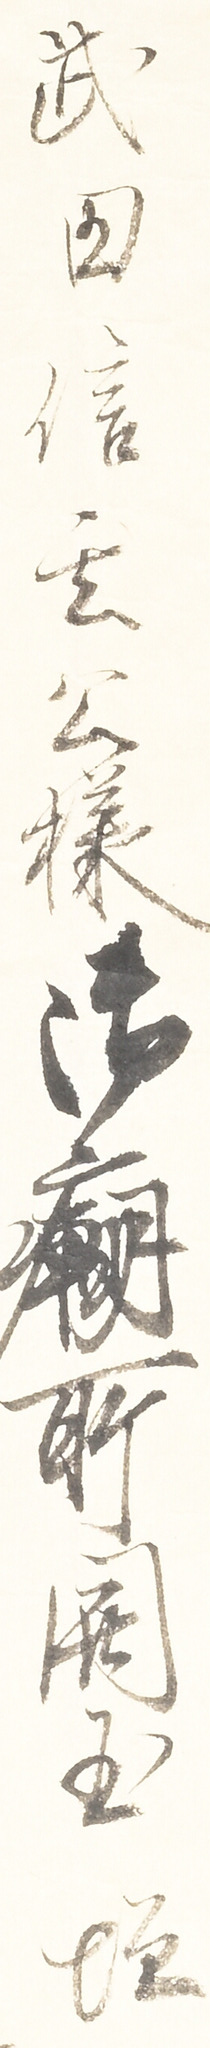武田信玄公様御廟所囲玉垣
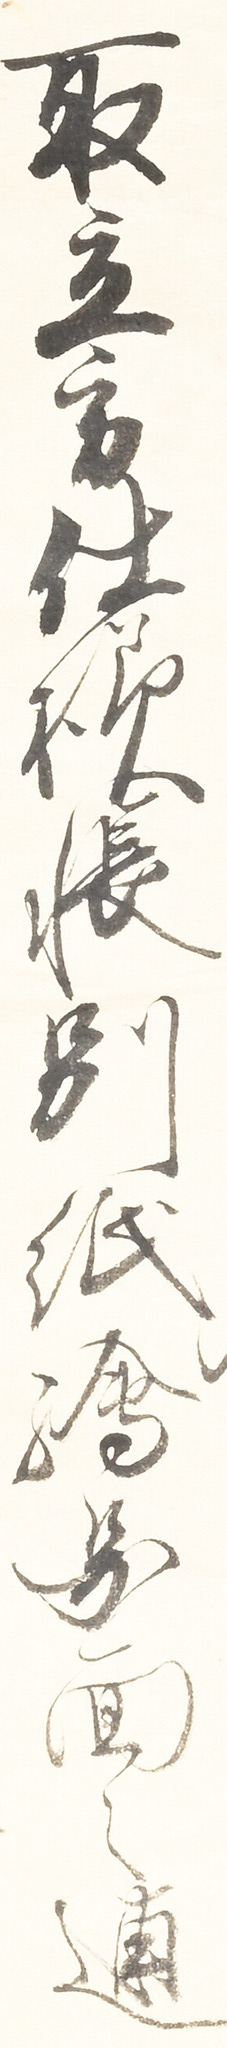取立方仕様帳別紙絵図面之通
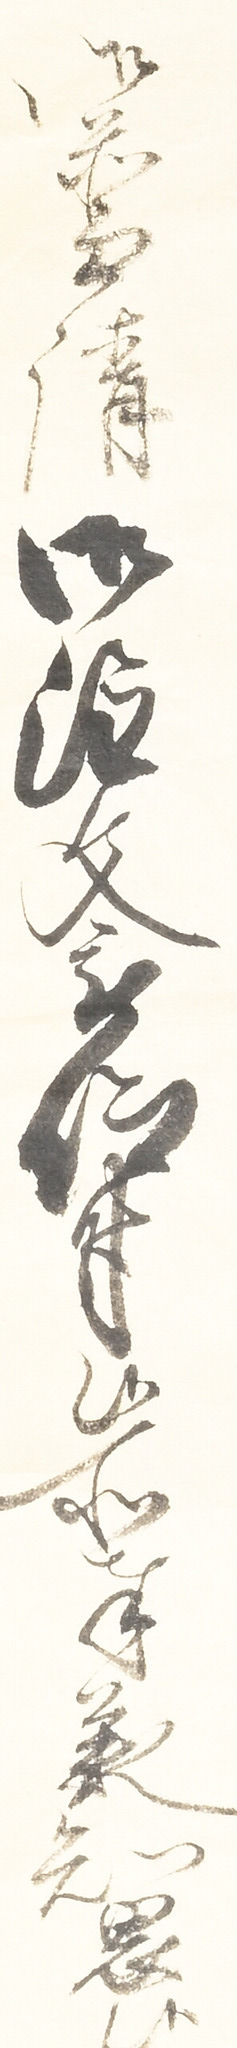御普請御注文被仰付候所奉承知畏候
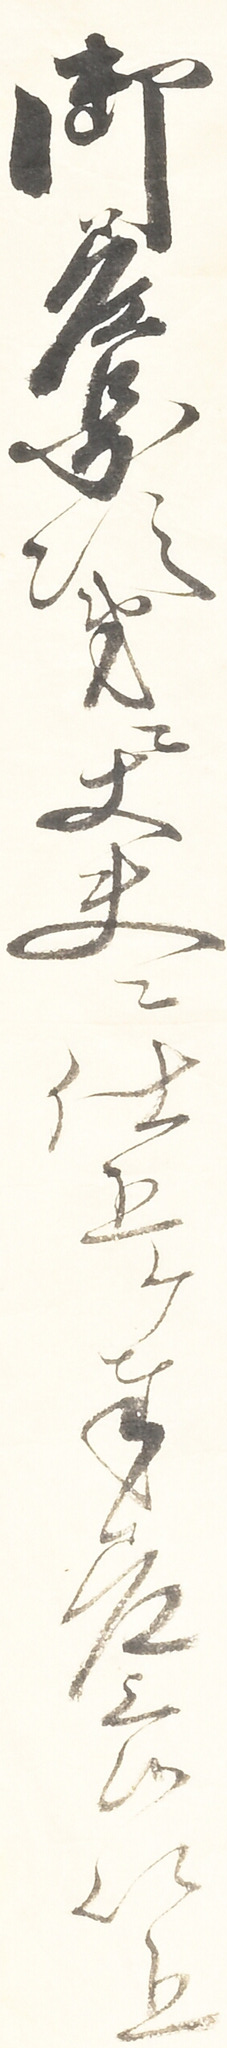御差図次第ニ丈夫ニ仕上ケ奉差上候以上
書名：天保十亥年六月武田信玄様御玉垣仕様書上帳
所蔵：伊那市立高遠町図書館・合同会社AMANE
